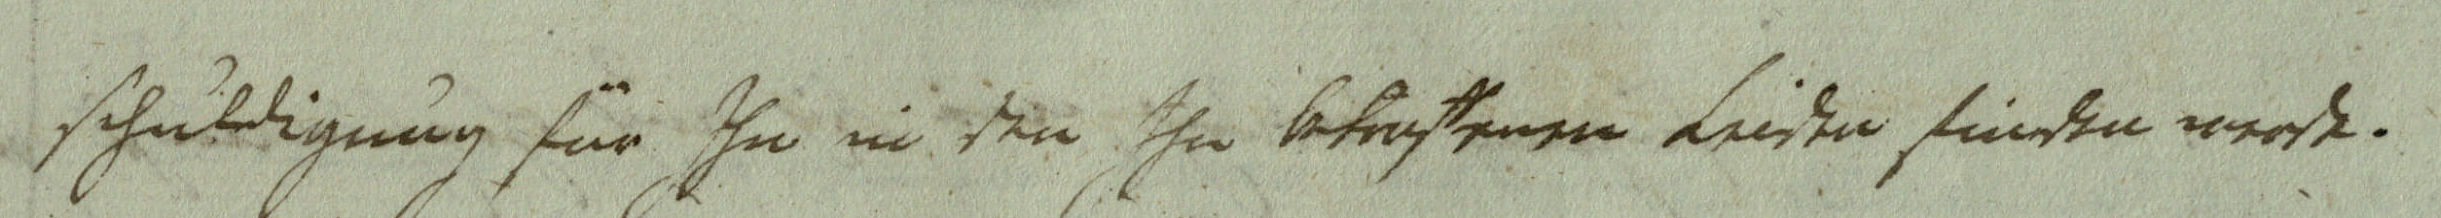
schuldigung für Ihn in den Ihn betroffenen Leiden finden werde.
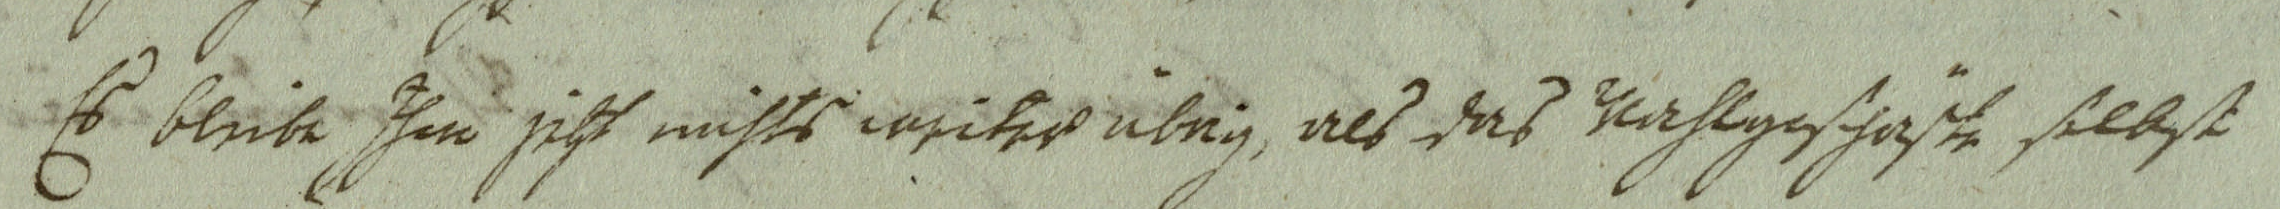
Es bleibe Ihm jetzt nichts weiter übrig, als das Wahlgeschäfte selbst
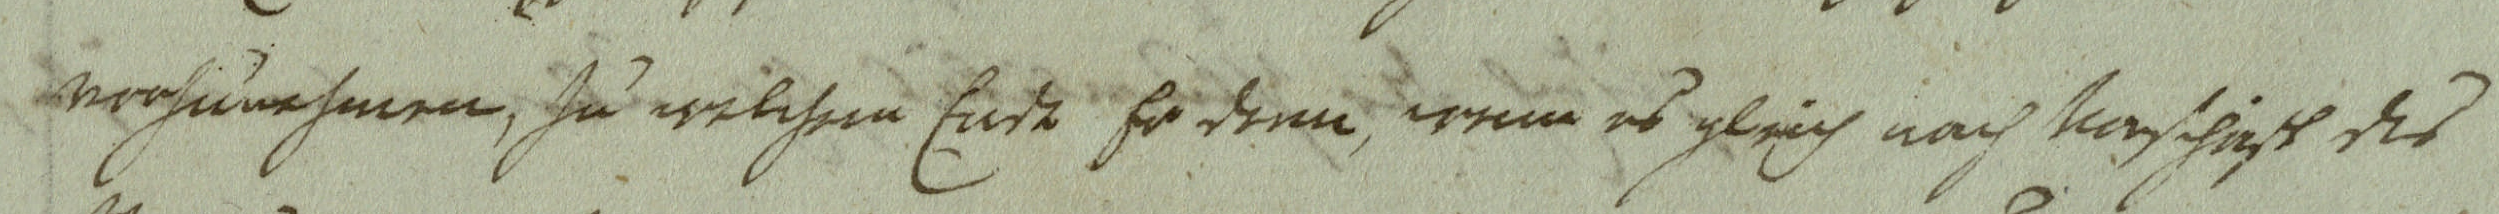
vorzunehmen, zu welchem Ende Er denn, wenn es gleich nach Vorschrift des
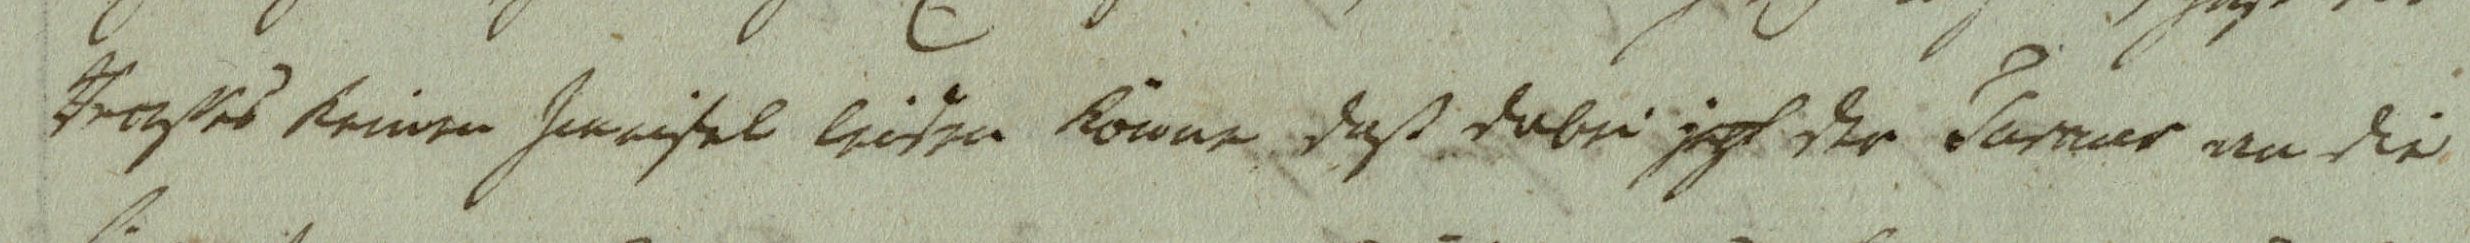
Recesses keinen Zweifel leiden könne, daß dabei jetzt der Turnus an die
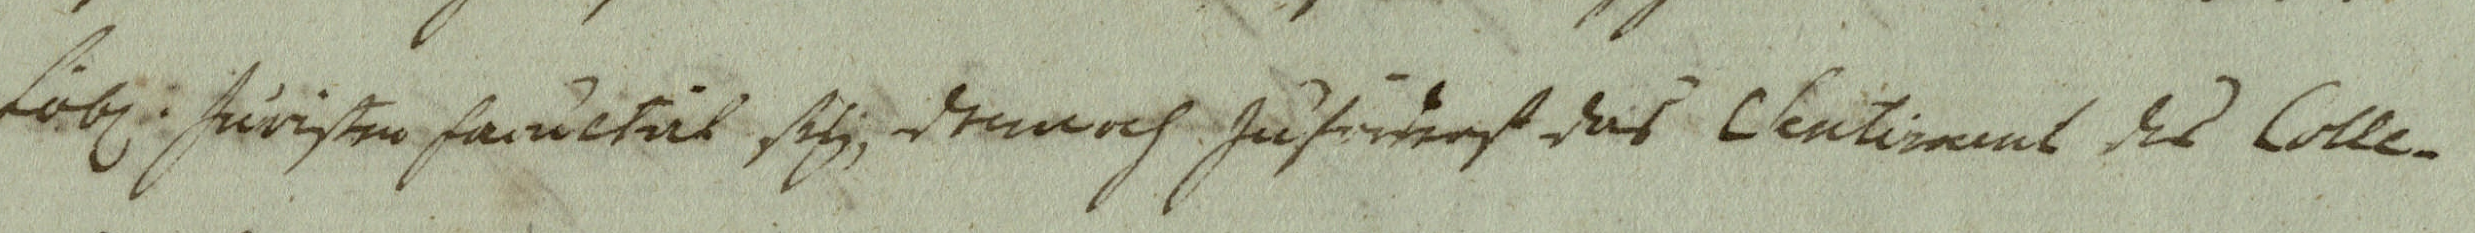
Löbl. Juristenfacultät seÿ, dennoch zuförderst das Sentiment des Colle¬
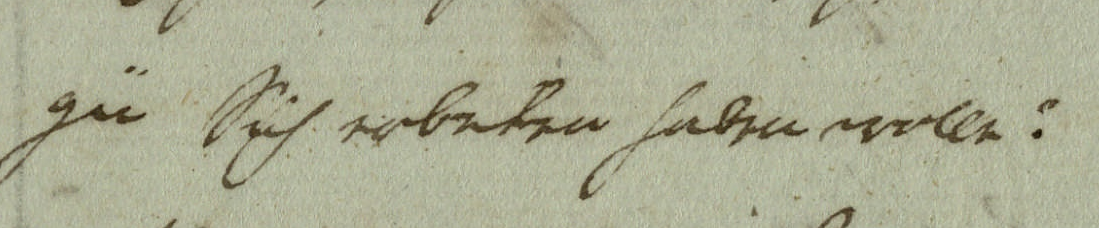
gii Sich erbeten haben wolle:
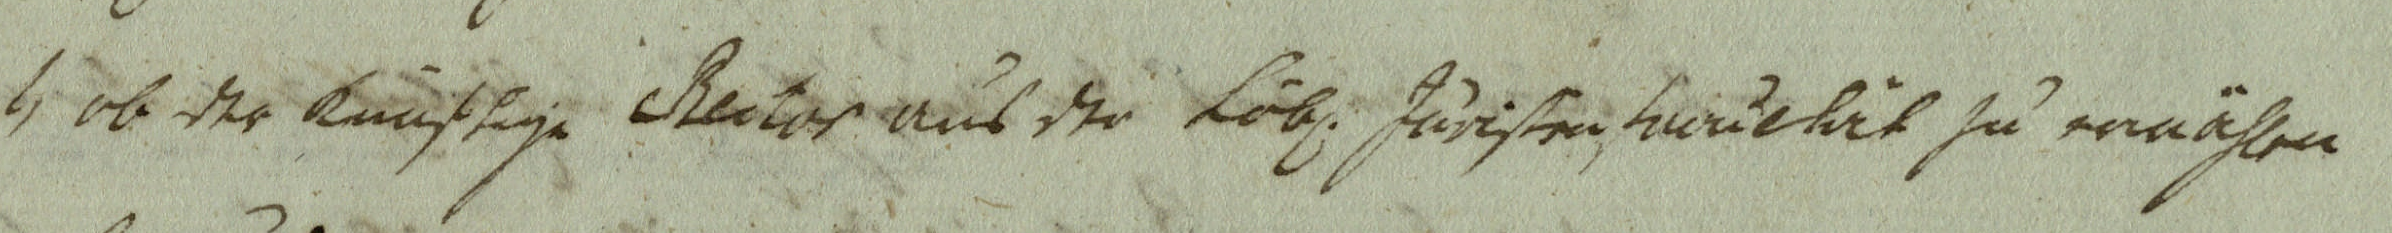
1, ob der künftige Rector aus der Löbl. Juristenfacultät zu erwählen
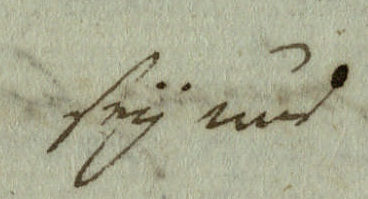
seÿ und
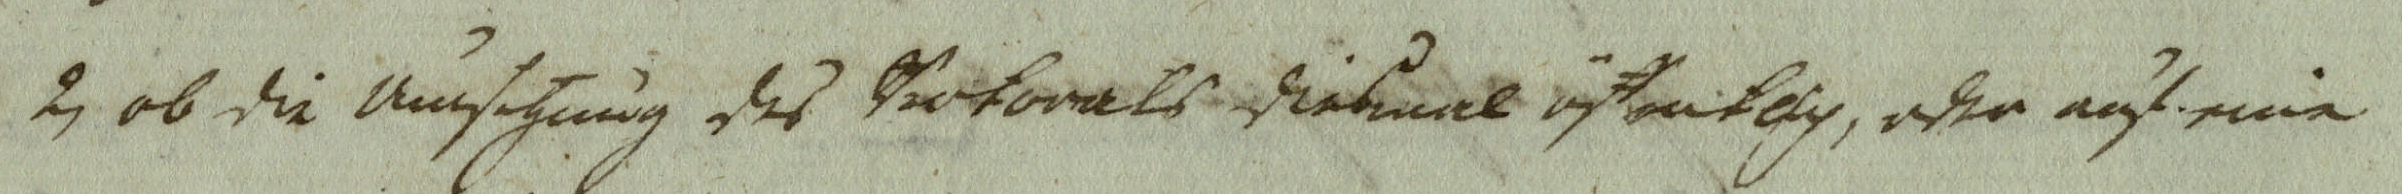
2, ob die Umsetzung des Rectorats diesmal öffentlich, oder auf eine
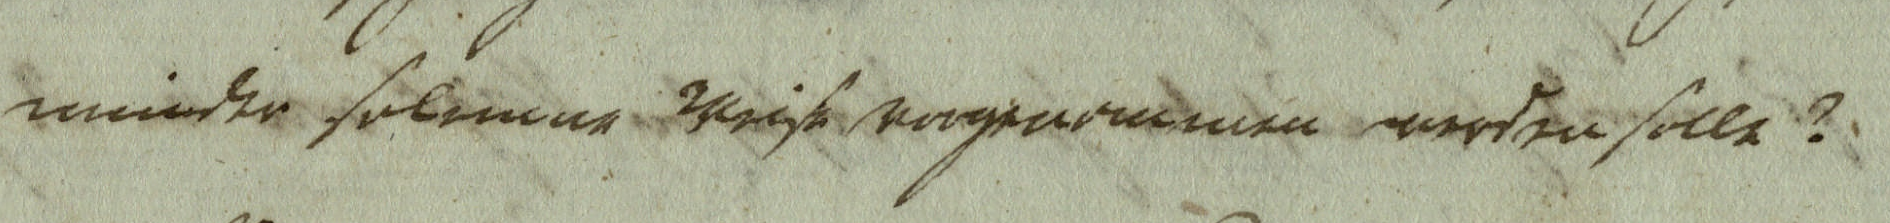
minder solemne Weise vorgenommen werden solle?
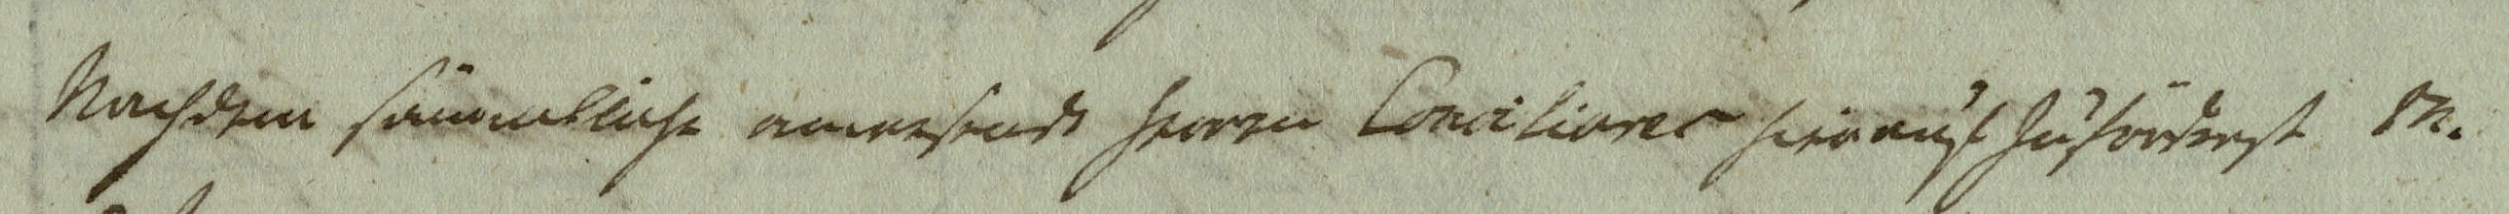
Nachdem sämmtliche anwesende Herren Conciliares hierauf zuförderst M.
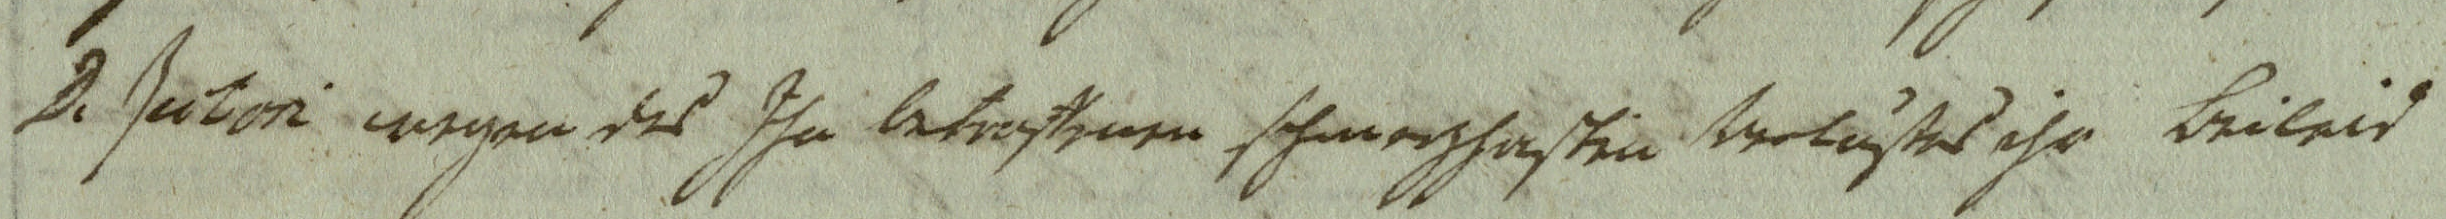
D. Rectori wegen des Ihn betroffenen schmerzhaften Verlustes ihr Beileid
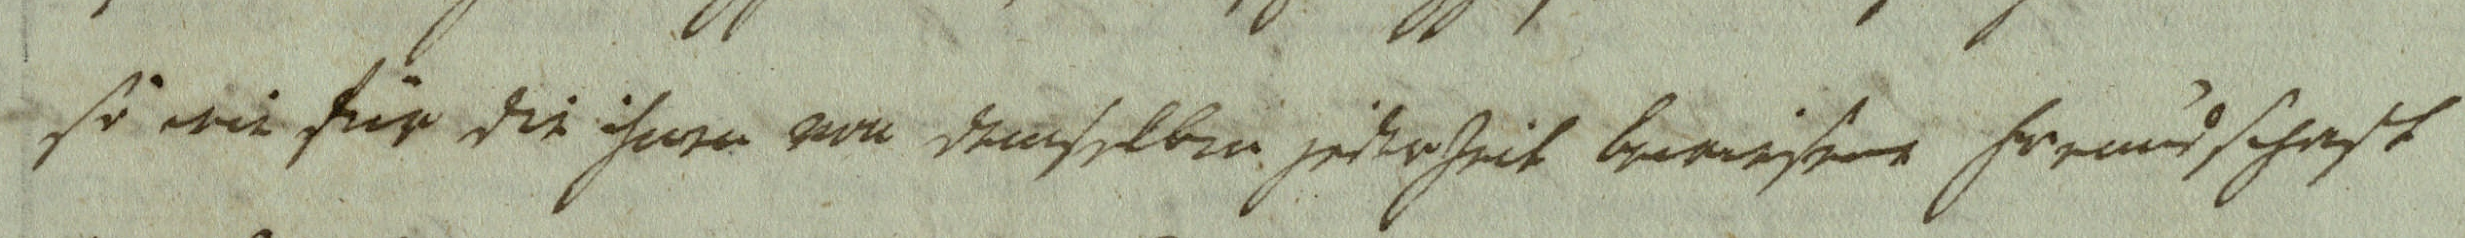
so wie für die ihnen von demselben jederzeit bewiesene Freundschaft
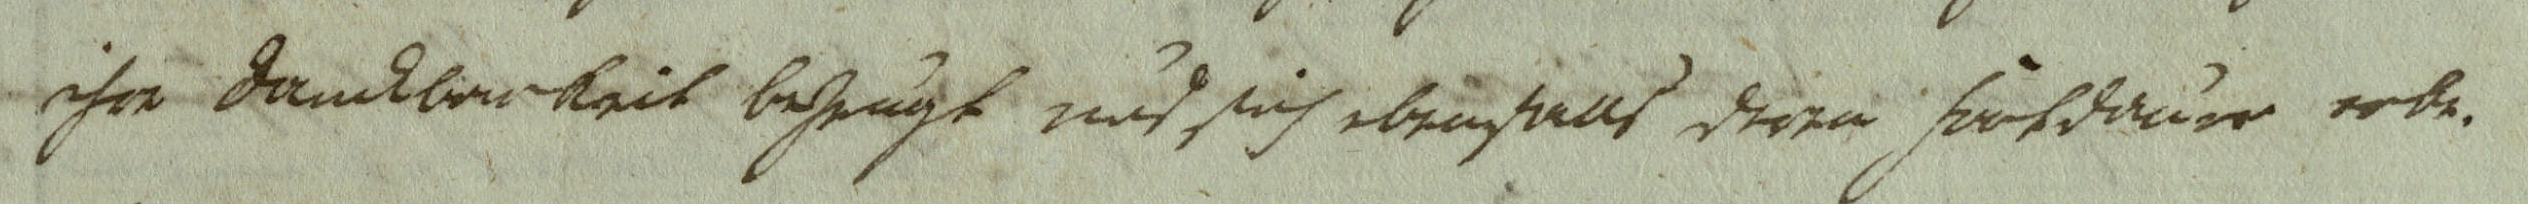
ihre Danckbarkeit bezeugt und sich ebenfalls deren Fortdauer erbe¬
